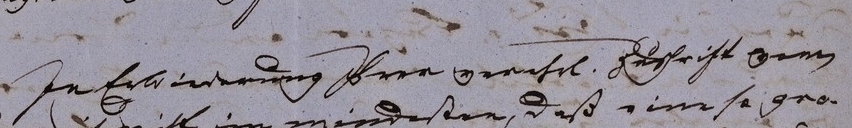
In Erwiederung Ihrer verehrl. Zuschrift vom
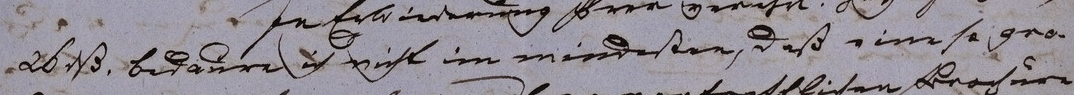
26 dß. bedaure ich nicht im mindesten, daß eine so gro-
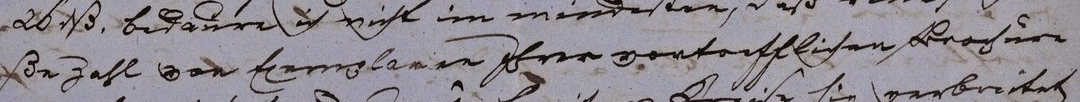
ße Zahl von Exemplaren Ihrer vortrefflichen Brochüre
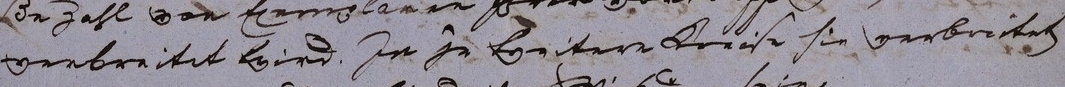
verbreitet wird. In je weitere Kreise sie verbreitet
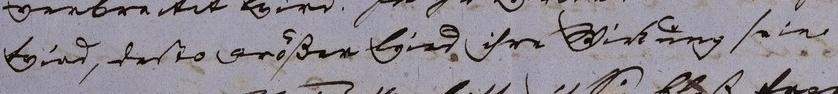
wird, desto größer wird ihre Wirkung sein.
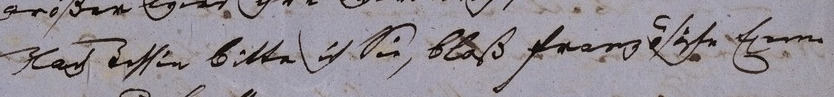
Nach Tessin bitte ich Sie, bloß französische Exem-
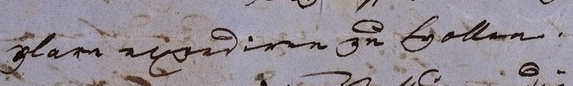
plare expediren zu wollen.
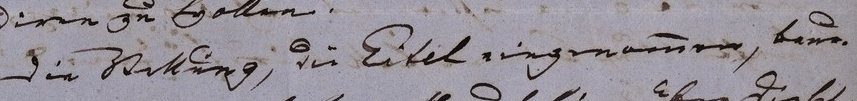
Die Stellung, die Eitel eingenommen, beur-
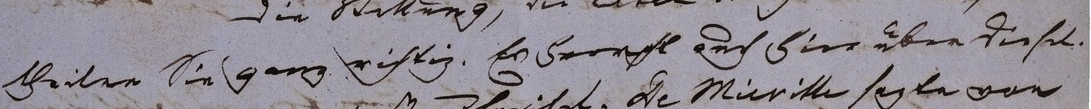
theilen Sie ganz richtig. Es herrscht auch hier über diesel-
